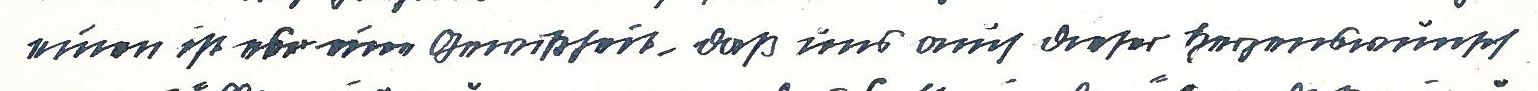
einen ist es eben eine Gewißheit, daß uns auch dieser Herzenswunsch
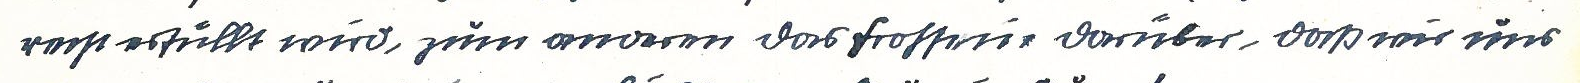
recht erfüllt wird, zum anderen das Frohsein darüber, daß wir uns
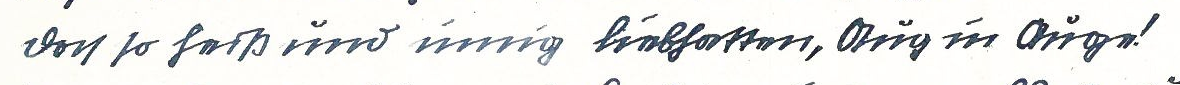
doch so heiß und innig liebhatten, Aug in Auge!
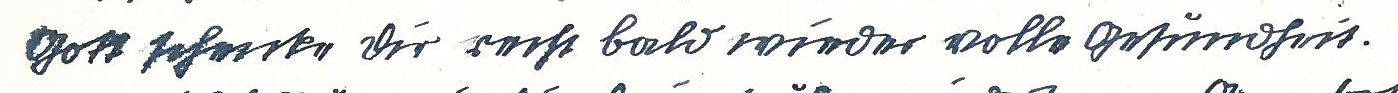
Gott schenke Dir recht bald wieder volle Gesundheit.
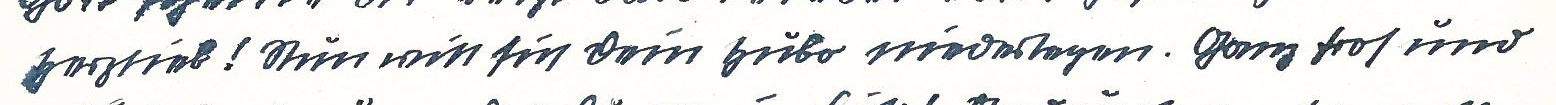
Herzlieb! Nun will sich Dein Hubo niederlegen. Ganz froh und
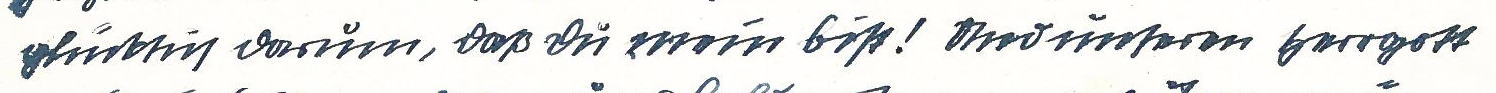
glücklich darum, daß Du mein bist! Und unseren Herrgott
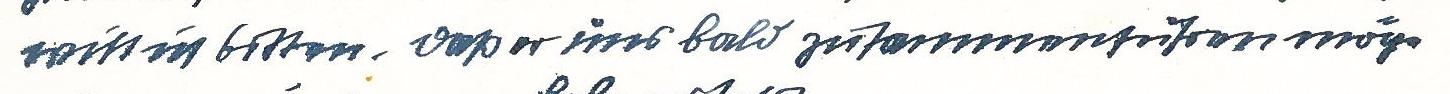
will ich bitten, daß er uns bald zusammenführen möge
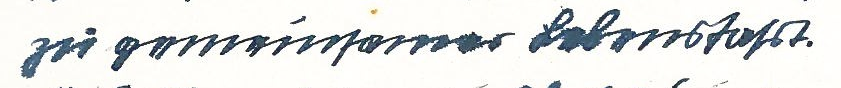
zu gemeinsamer Lebensfahrt.
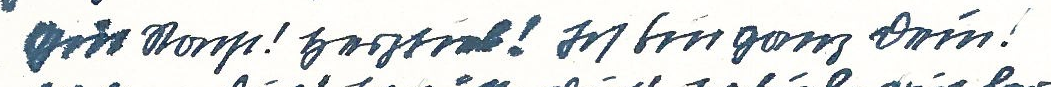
Gut Nacht! Herzlieb! Ich bin ganz Dein!
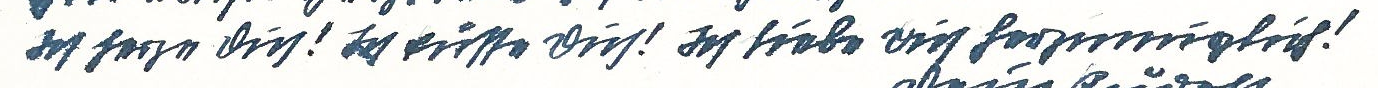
Ich herze Dich! Ich küsse Dich! Ich liebe Dich herzinniglich!
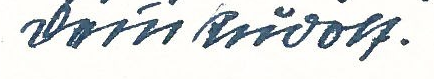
Dein .
